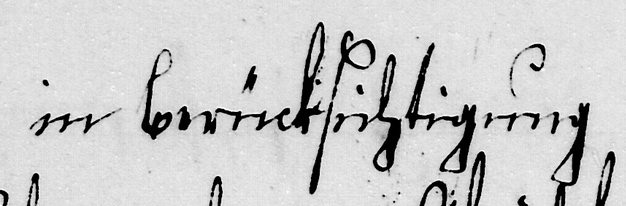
in Berücksichtigung
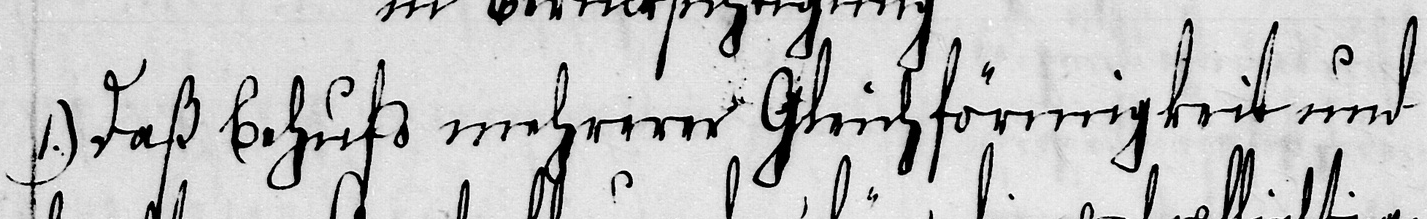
1.) Daß Behufs mehrerer Gleichförmigkeit und
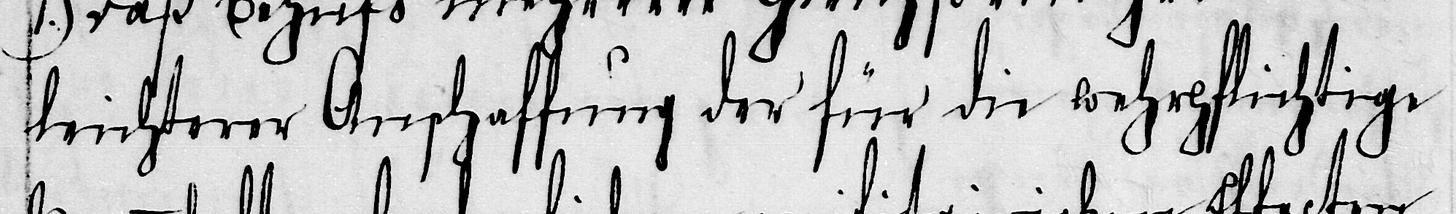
leichterer Anschaffung der für die wehrpflichtige
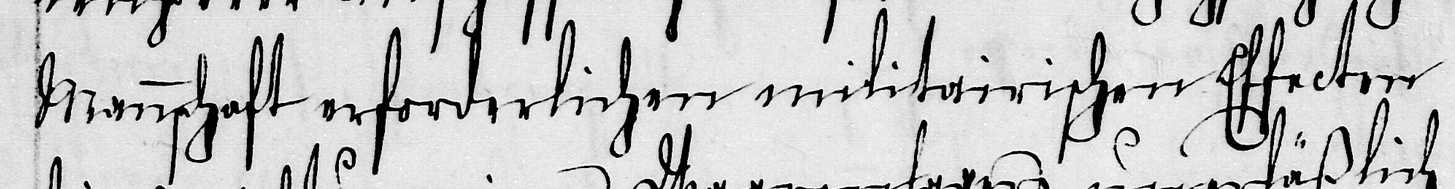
Mannschaft erforderlichen militairischen Effecten
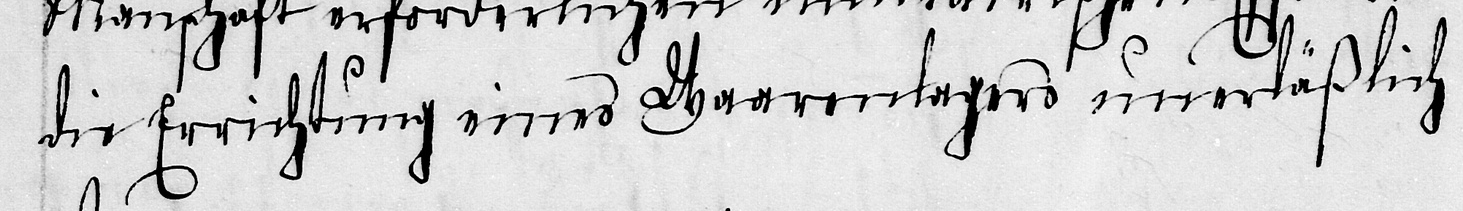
die Errichtung eines Waarenlagers unerläßlich
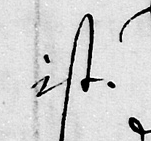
ist.
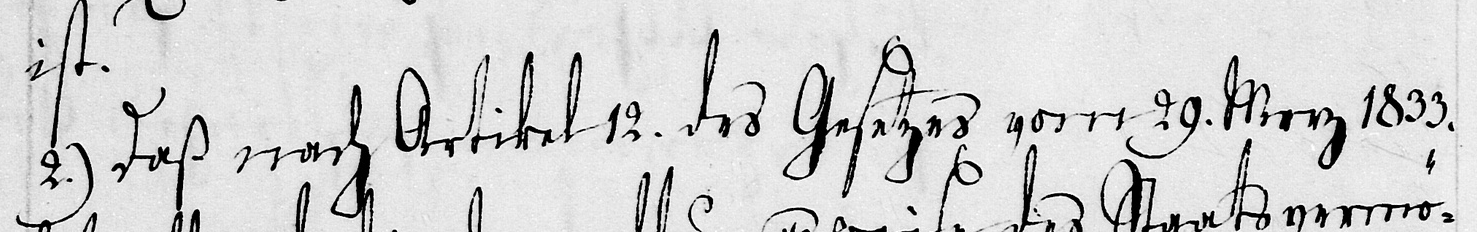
2.) Daß nach Artikel 12. des Gesetzes vom 29. Merz 1833.
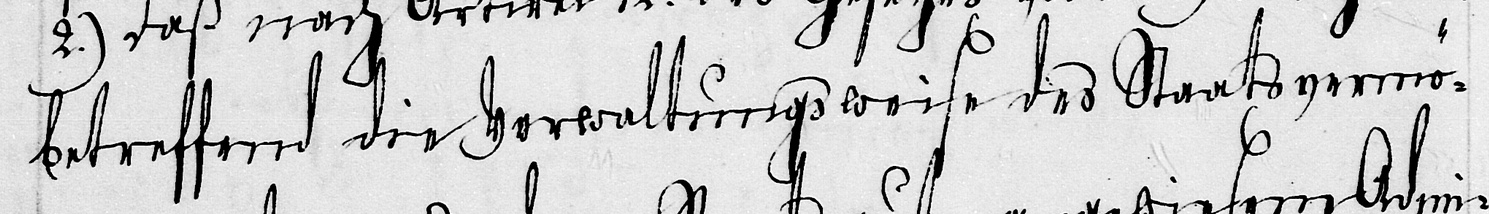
betreffend die Verwaltungsweise des Staatsvermö¬
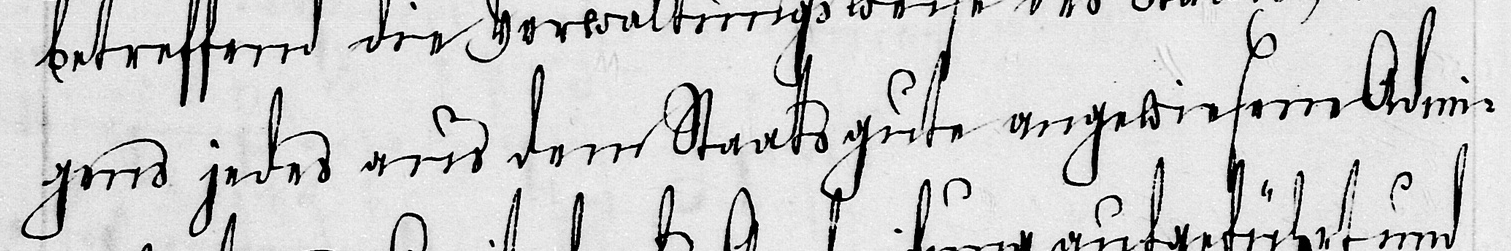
gens jedes aus dem Staatsgute angewiesene Admi¬
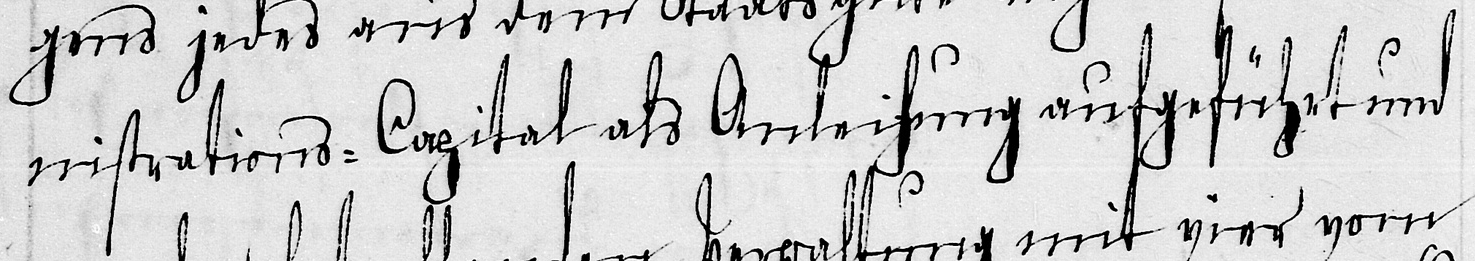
nistrations-Capital als Anleihung aufgeführt und
